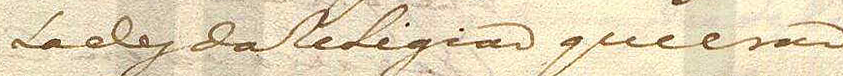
lados da Religião que erão
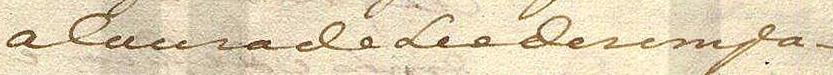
a Cauza de seo dezempa
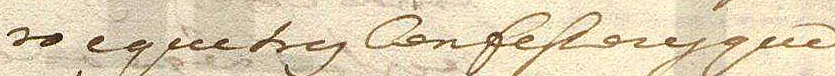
ro e que tres Confessores que
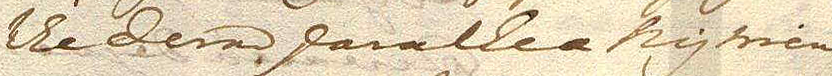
lhe deraõ para lhe assistirem
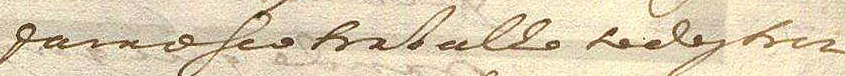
para o seo trabalho todos trez
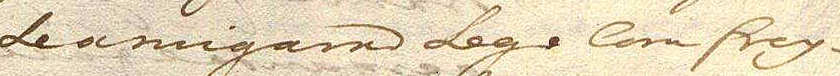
se amigaraõ logo com frey
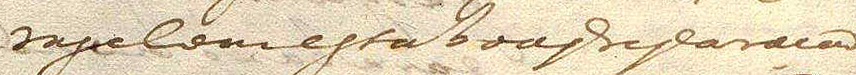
ras e com esta boa preparação
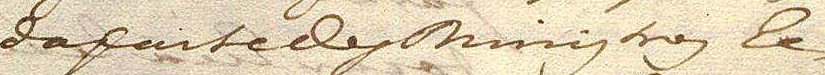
da parte dos Ministros he
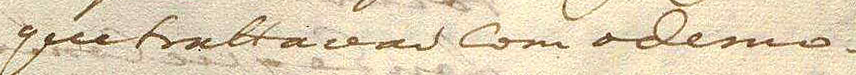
que tractavaõ com o demo
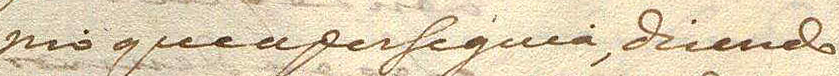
nio que a perseguia, dizendo
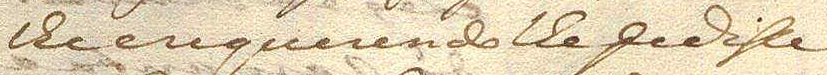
lhe e requerendo lhe pedisse
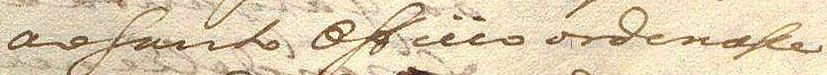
ao santo Officio ordenasse
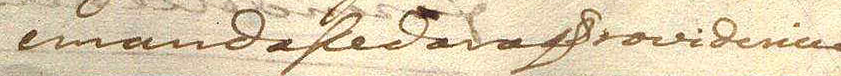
e mandasse dar a providencia
